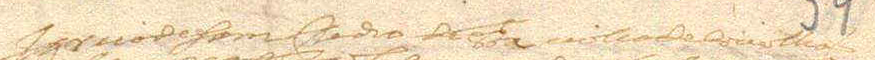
Jgreia de sam Pedro desta uilla de Couilhā
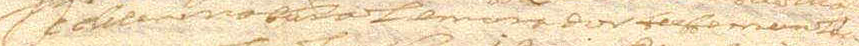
e della natural e morador testemunha
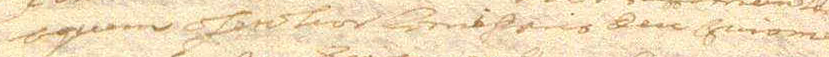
a quem o senhor Comissario deu Juramen
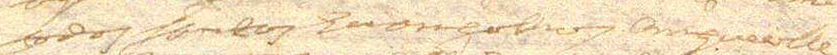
to dos santos Euangelhos em que elle
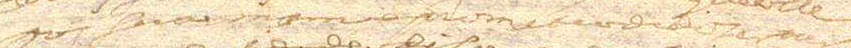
pos sua mam e prometeo de dizer uer
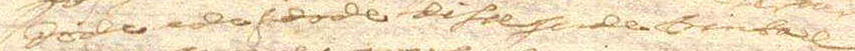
dade e de Jdade disse ser de trinta e
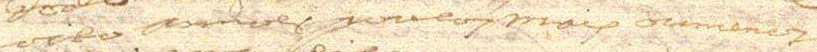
oito annos poucos mais ou menos
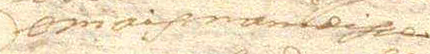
e mais nam disse
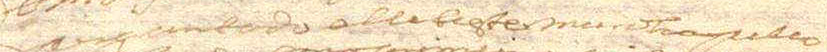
perguntado elle testemunha pello
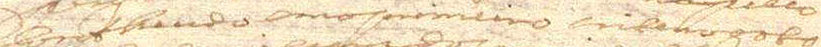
contheudo em o primeiro interrogato
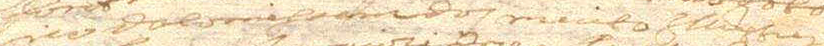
rio da comissam dos muito Jllustres
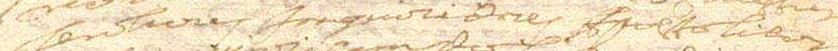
senhores Jnquizidores Apostolicos
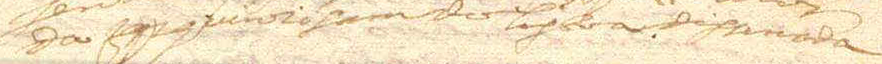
da Jnquizisam de lisboa dise nada
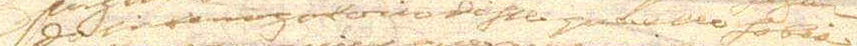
do interrogatorio disse que elle sabia
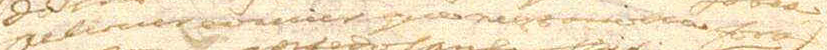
pello uer e ouuir que nesta uilla foraõ
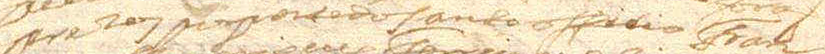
prezos por parte do santo officio Fran
